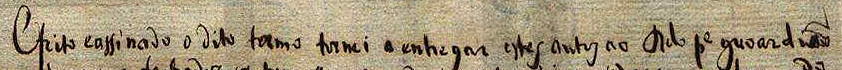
E feito e assinado o dito termo tornei a entregar estes autos ao Rdo pe guoardiaõ
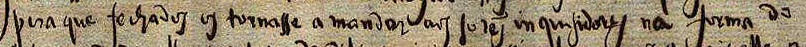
pera que fechados os tornasse a mandar aos sorēs inquisidores na forma do
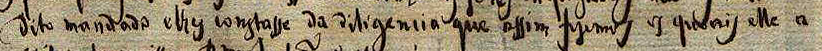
dito mandado e lhes constasse da diligencia que assim fazemos os quoais elle a
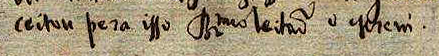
ceitou pera isso Brmeo leitaõ o escreui.
